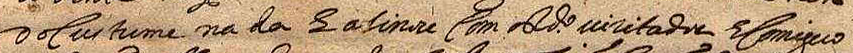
do Custume nada E asinou Com o Rd.o uizitador E Comiguo
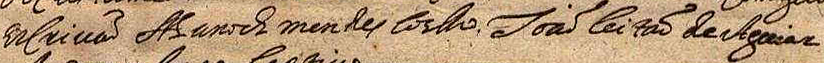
EsCriuaõ Manoel mendes Coelho. Ioaõ leitaõ de Aguiar
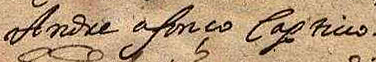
Andre afonço Captiuo
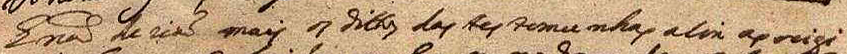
E não deziaõ mais os dittos das testemunhas asin as origi
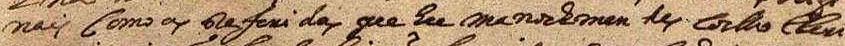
nais Como as Referidas que Eu manoel mendes Coelho Cleri
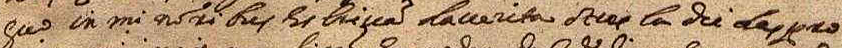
guo in minoribus EsCriuaõ da uezita o tresladei das pro
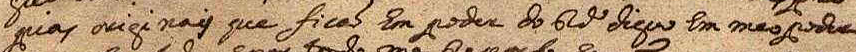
pias originais que ficaõ Em poder do Rdo diguo Em meo poder
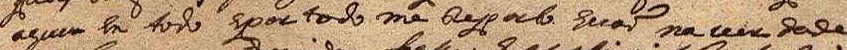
a quem En todo E por todo me Reporto E uaõ na uerdade
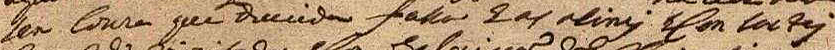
sen Couza que duuida fassa E as asinej E Concertej
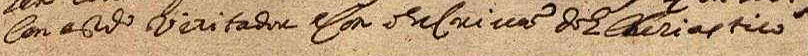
Con o Rdo Vizitador e Con o EsCriuaõ do ECleziastico
